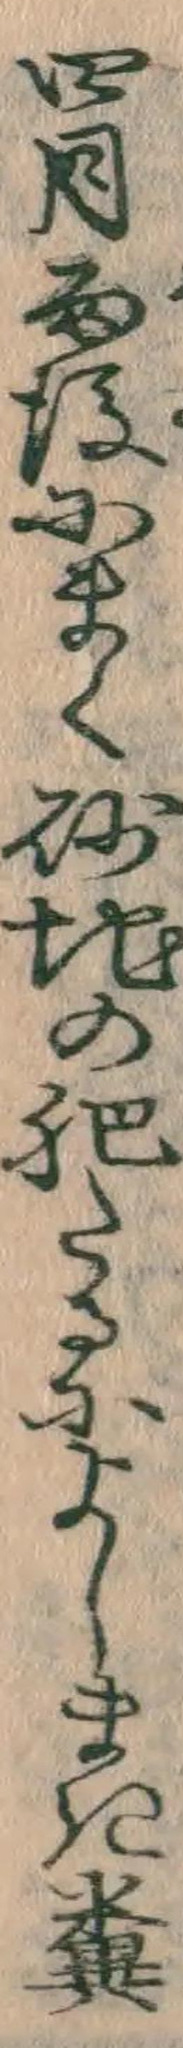四月雨後にまく砂地の肥たるによしまき糞
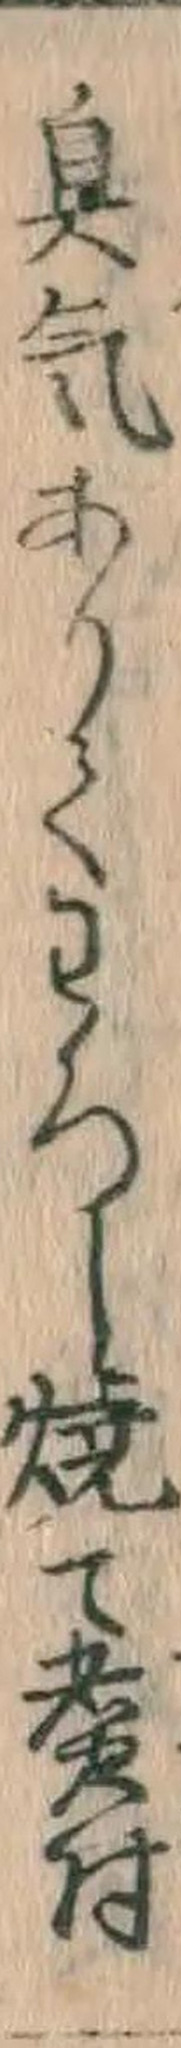臭気ありてわろし焼て煮付
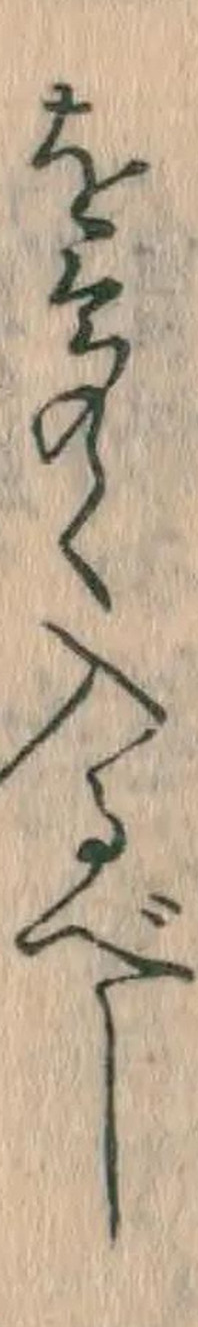を多く入るべし
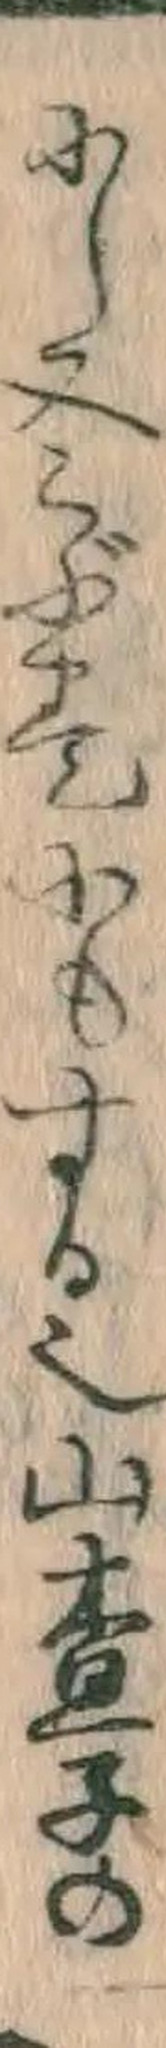にし又こぶ巻にもする也山査子の
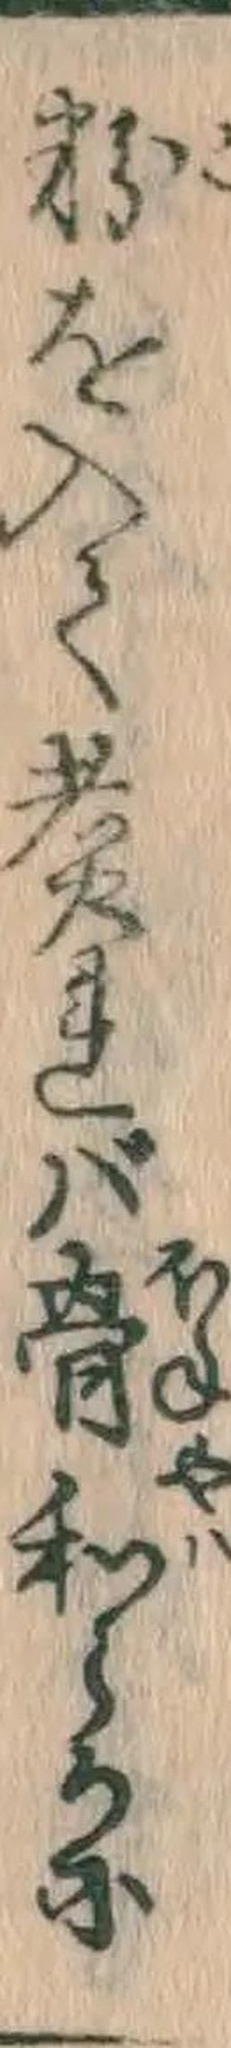粉を入て煮れば骨和らかに
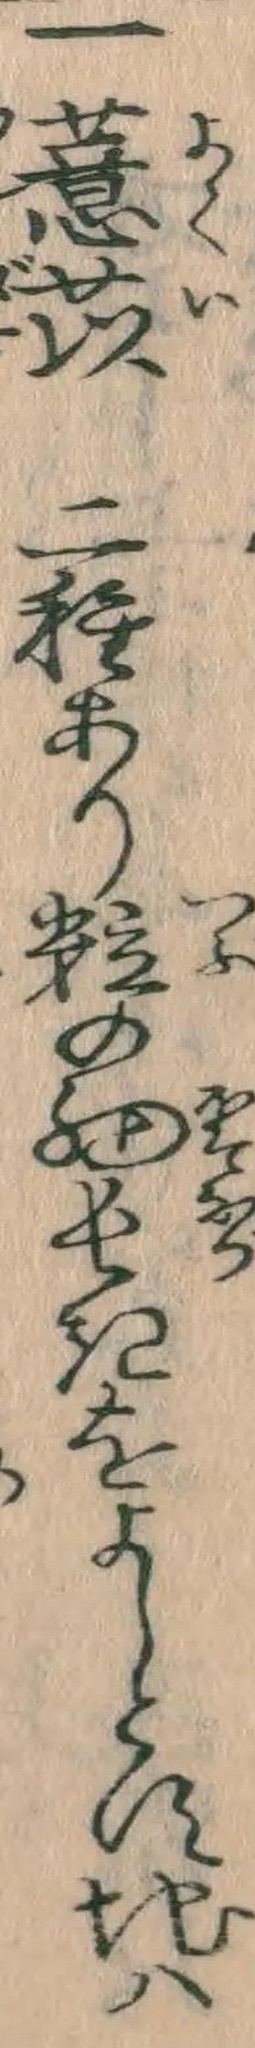一薏苡二種あり粒の細長きをよしとす地は
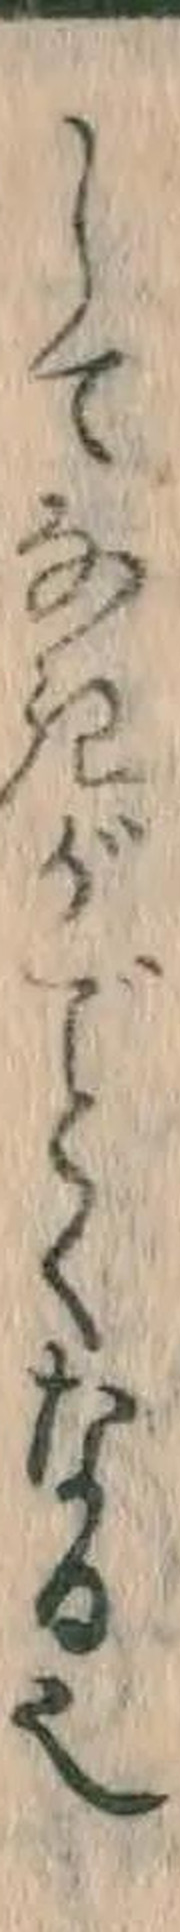してなきがごとくなる也
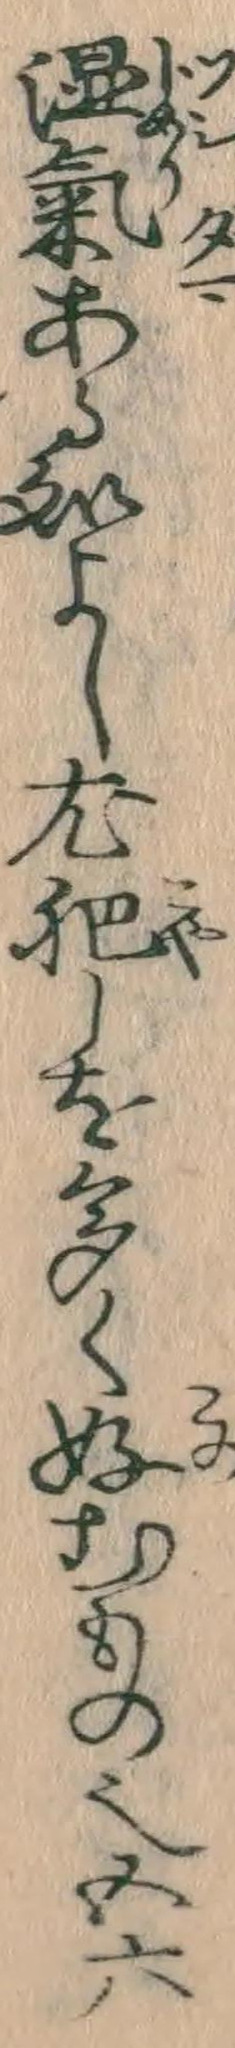湿気ある処よし尤肥しを多く好むもの也五六
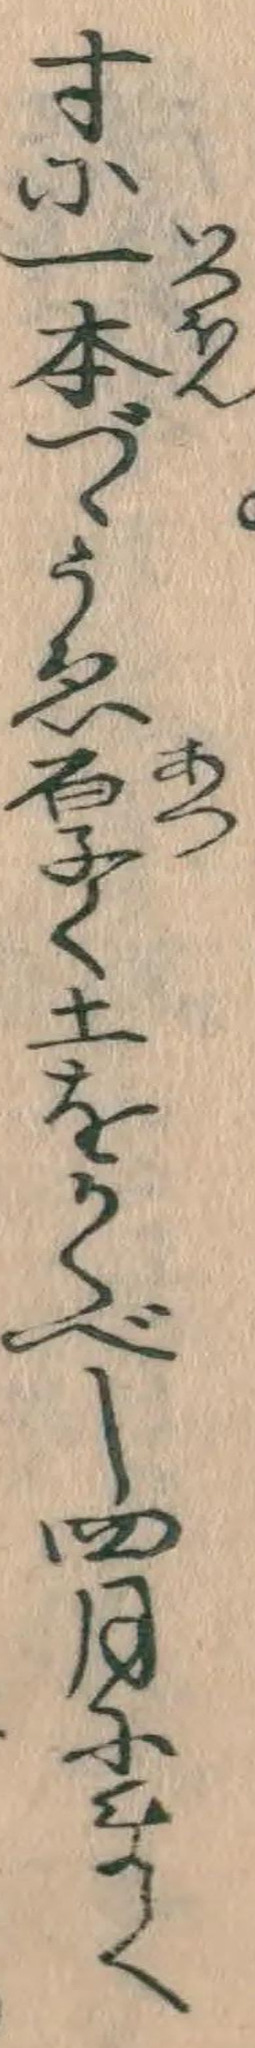寸に一本づゝうゑ厚く土をかくべし四月にまく
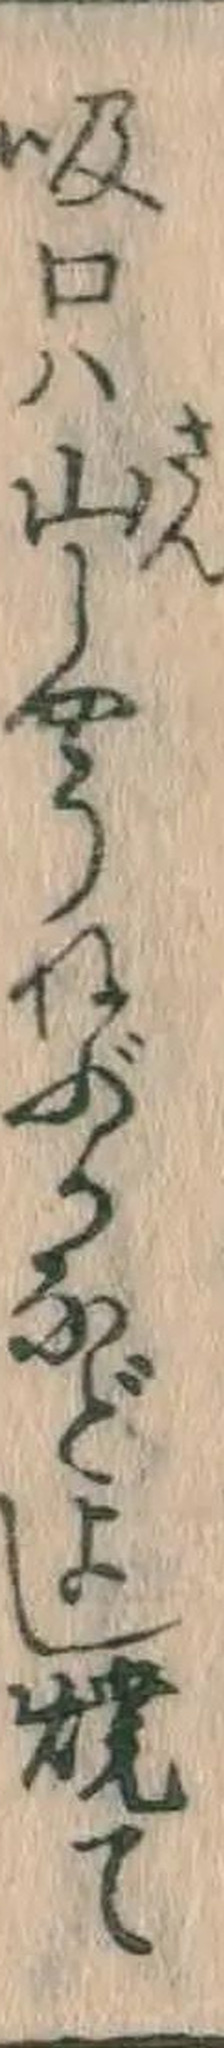吸口は山しやうねぶかなどよし焼て
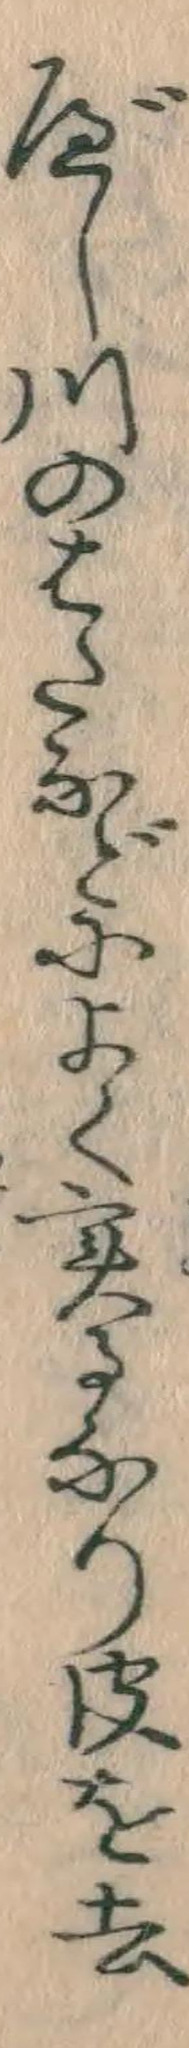べし川のはたなどによく実るなり皮を去
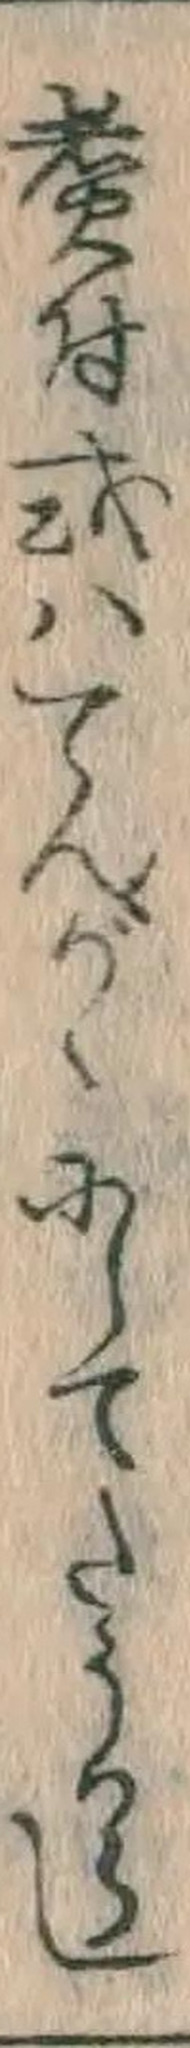煮付或はてんがくにしてたうからし
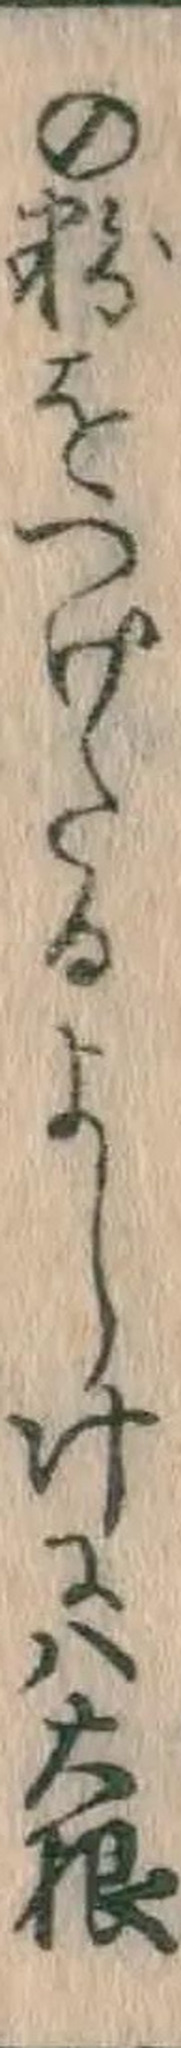の粉をつけたるよし汁には大根
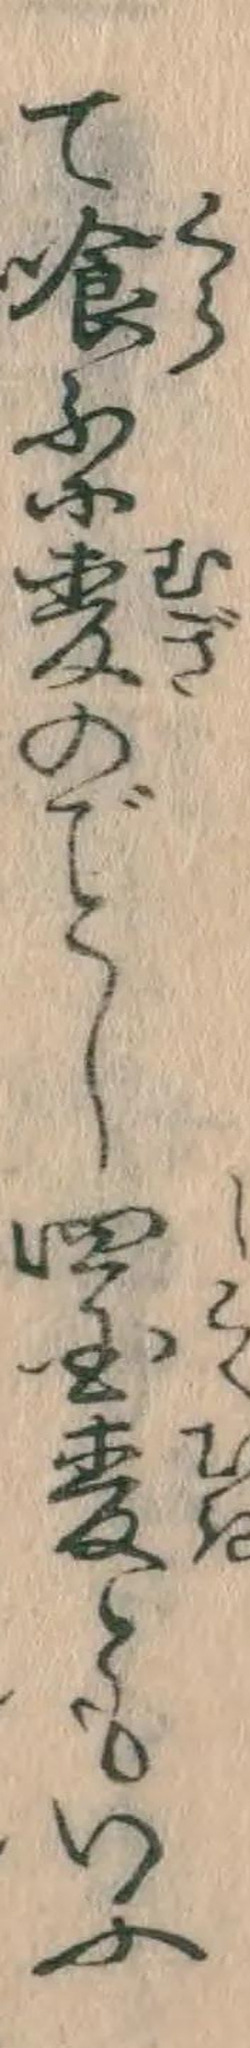て喰ふに麦のごとし四国麦ともいふ
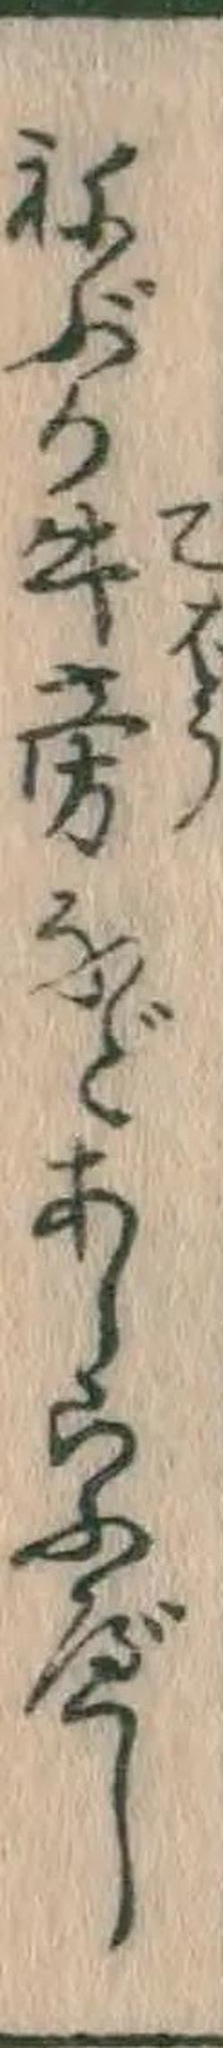ねぶか牛旁などあしらふべし
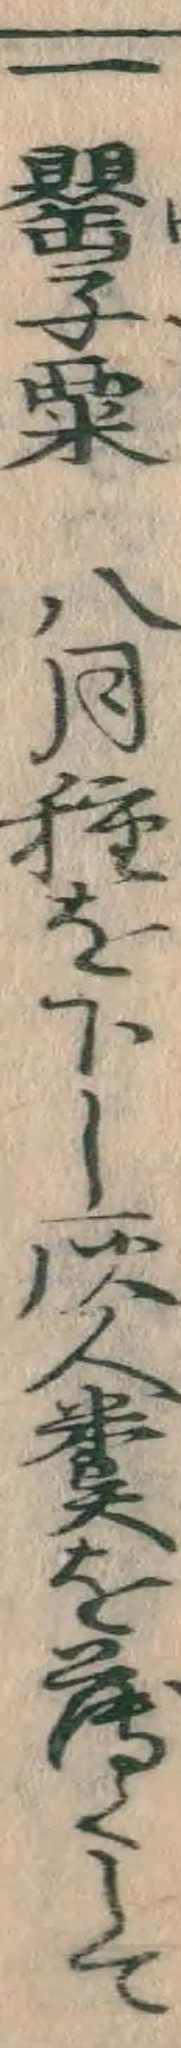一罌子粟八月種を下し灰人糞を薄くして
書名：広益秘事大全 3巻. [5]
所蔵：国立国会図書館 National Diet Library, JAPAN
